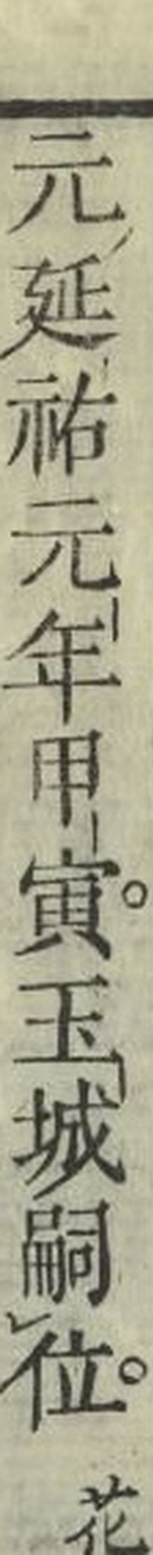元延-祐元-年甲-寅。玉-城嗣位。
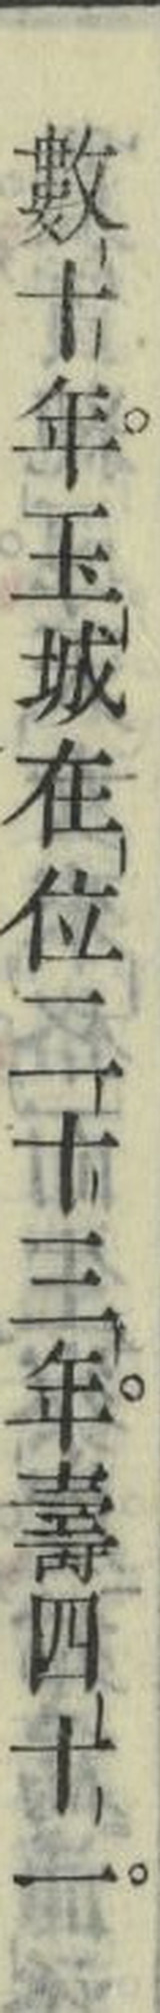数-十-年。玉-城在-位二-十-三-年。寿四-十-一。

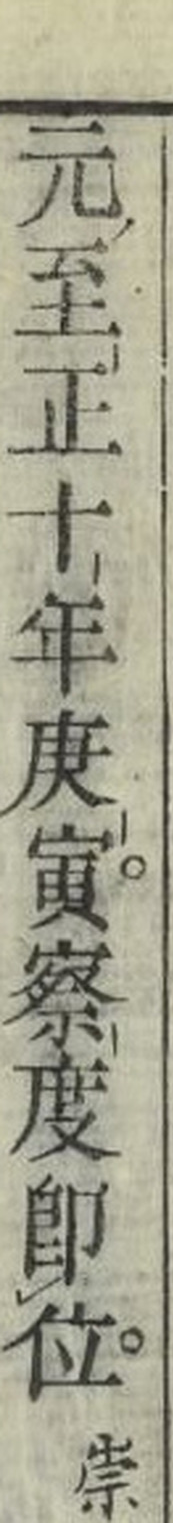元至-正十-年庚-寅。察-度即位。
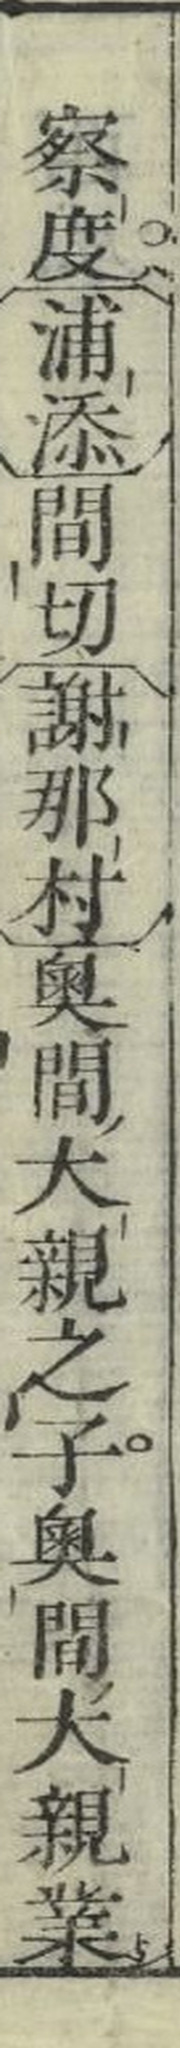察-度。[浦-添]間-切[謝-那-村]奥-間大-親之-子。奥-間大-親業

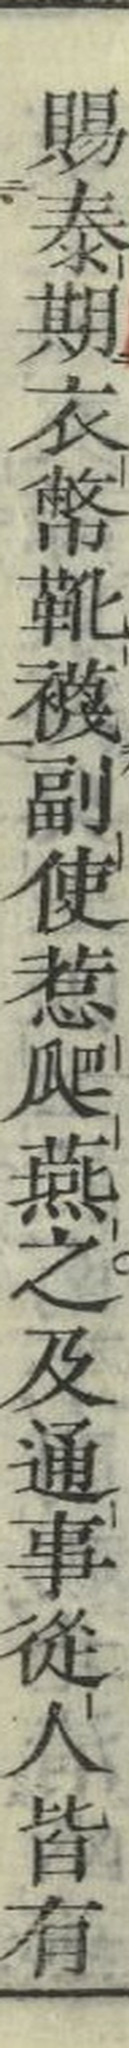賜泰-期衣-幣靴-襪。副-使惹-爬-燕-之。及通-事従-人皆有

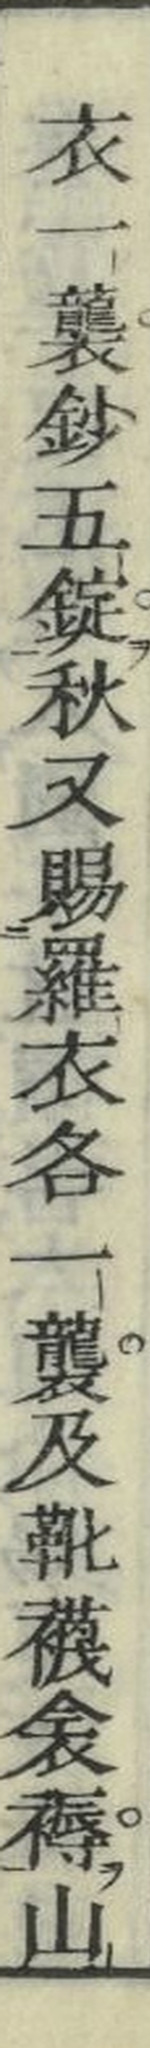衣一-襲。鈔五-錠。秋又賜羅-衣各一-襲。及靴襪衾褥。山-
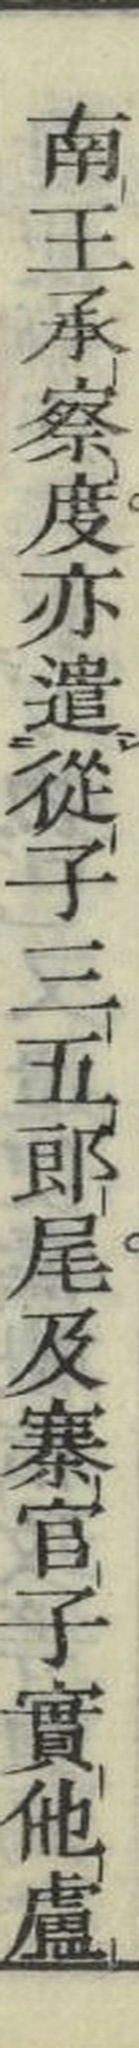南-王承-察-度。亦遣従-子三-五-郎-尾。及寨-官-子実-他-盧-

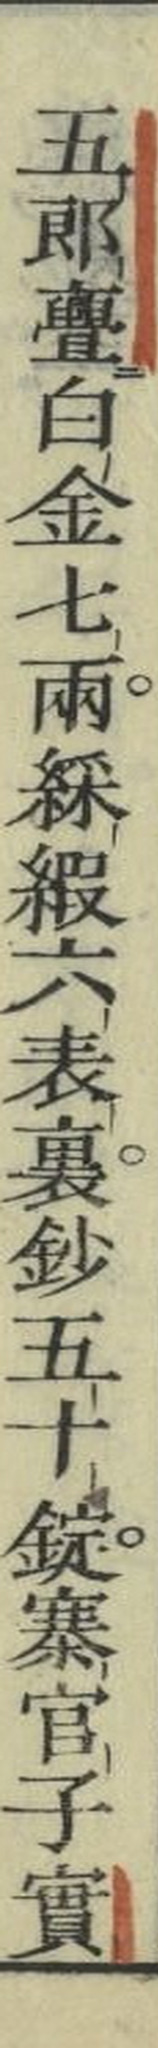五-郎-亹白-金七-両。綵-緞六-表-裏。鈔五-十-錠。寨-官-子実-

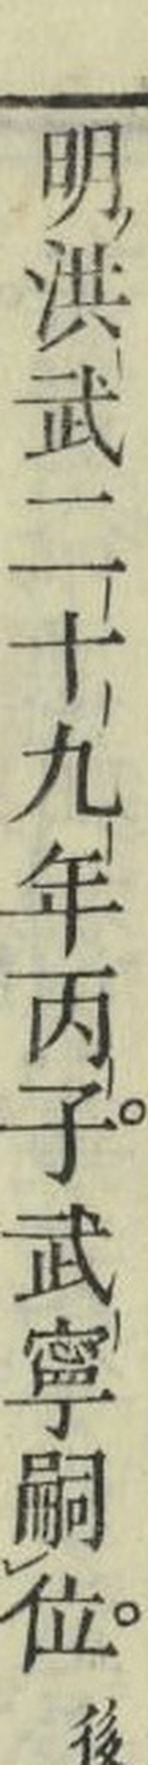明洪-武二-十-九-年丙-子。武-寧嗣位。

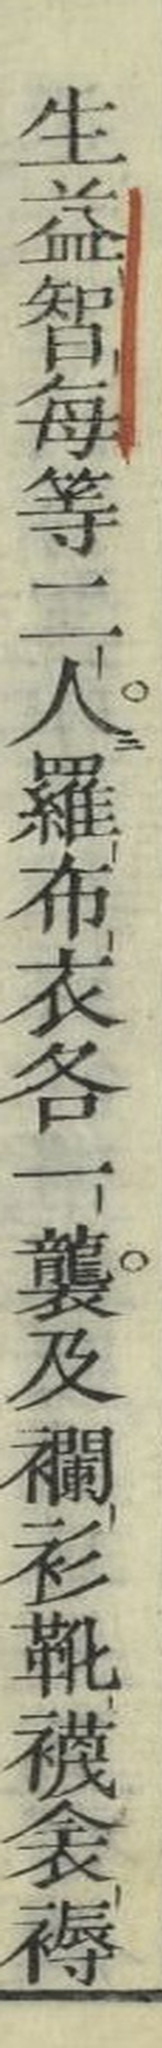生益-智-毎等二-人。羅-布-衣各一-襲。及襴-衫靴-襪衾-褥

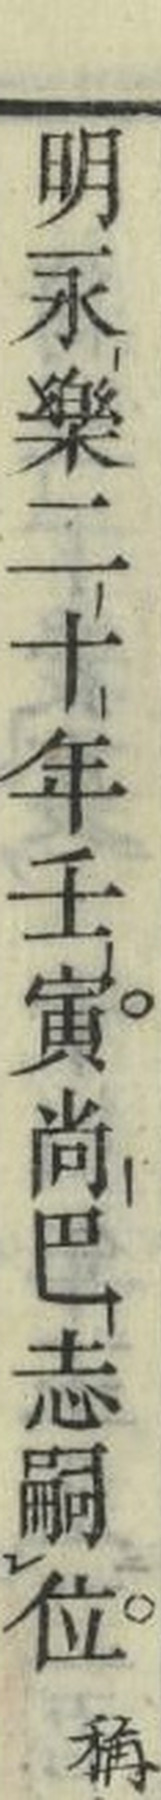明永-楽二-十-年壬-寅。尚-巴-志嗣位。
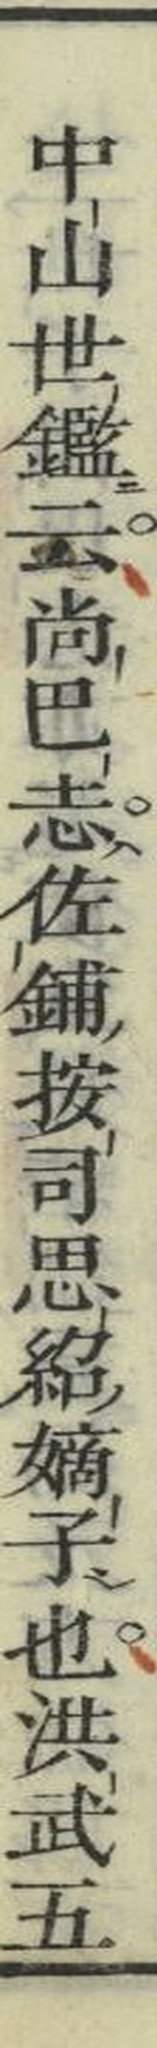中-山世-鑑云。尚-巴-志。佐-鋪按-司思-紹嫡-子也。洪-武五

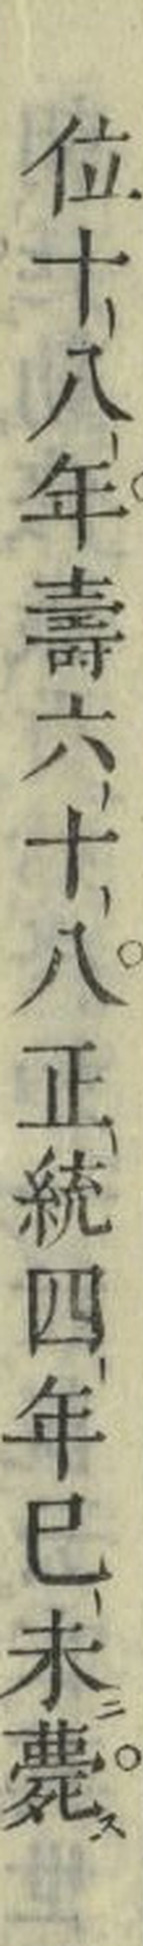位十-八-年。寿六-十-八。正-統四-年巳-未薨。
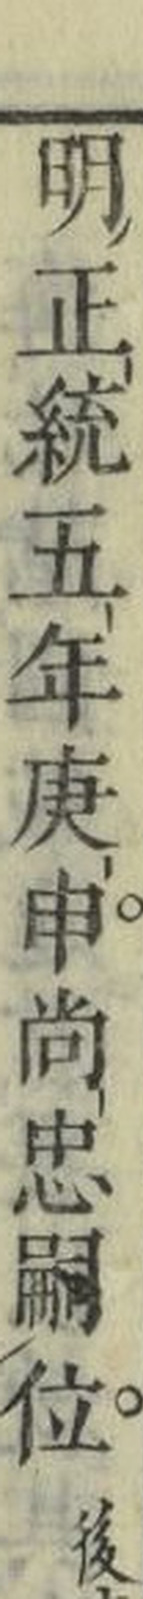明正-統五-年庚-申。尚-忠嗣位。

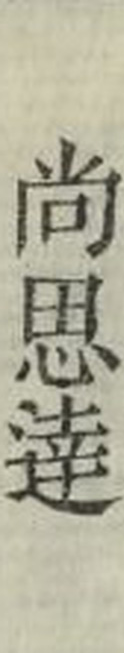尚思達
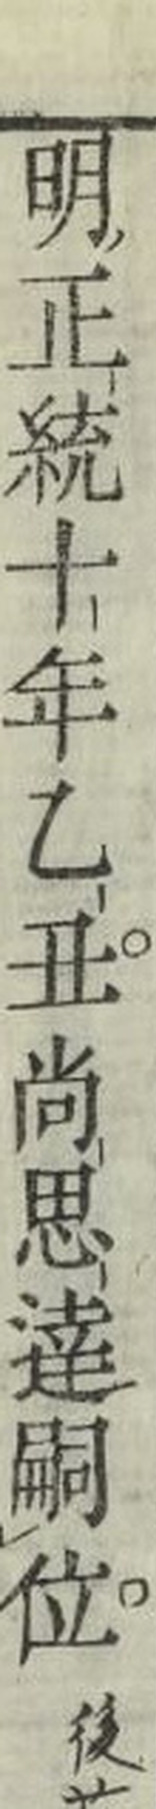明正-統十-年乙-丑。尚-思-達嗣位。
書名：中山伝信録 巻三
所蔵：University of the Ryukyus Library
